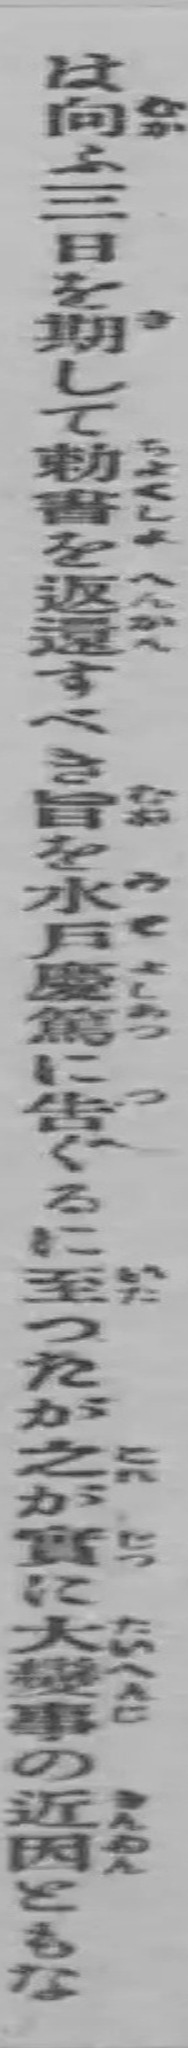は向ふ三日を期して勅書を返還すべき旨を水戸慶篤に告ぐるに至つたが之が実に大変事の近因ともな
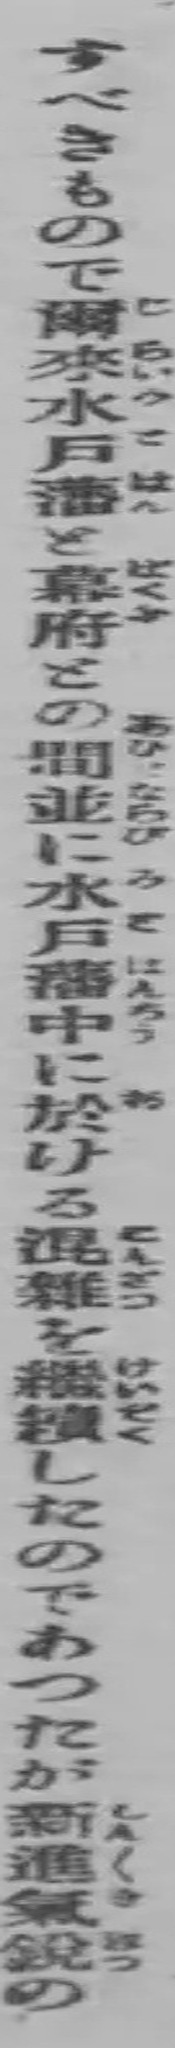すべきもので爾来水戸藩と幕府との間並に水戸藩中に於ける混雑を継続したのであつたが新進気鋭の
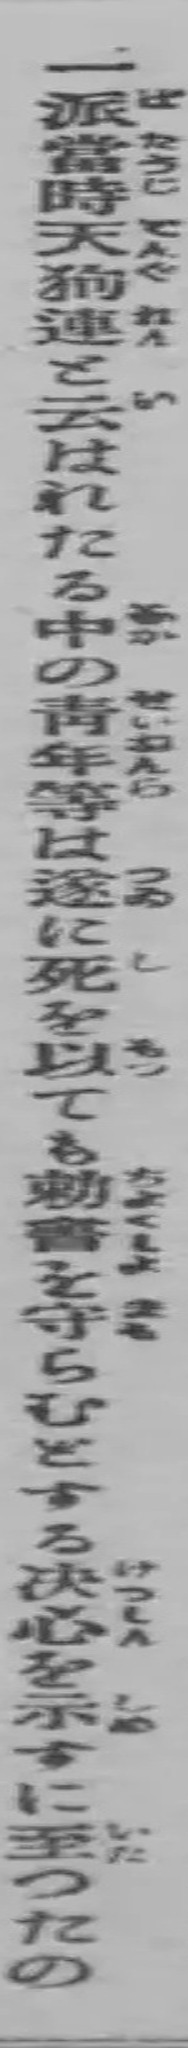一派当時天狗連と云はれたる中の青年等は遂に死を以ても勅書を守らむとする決心を示すに至つたの
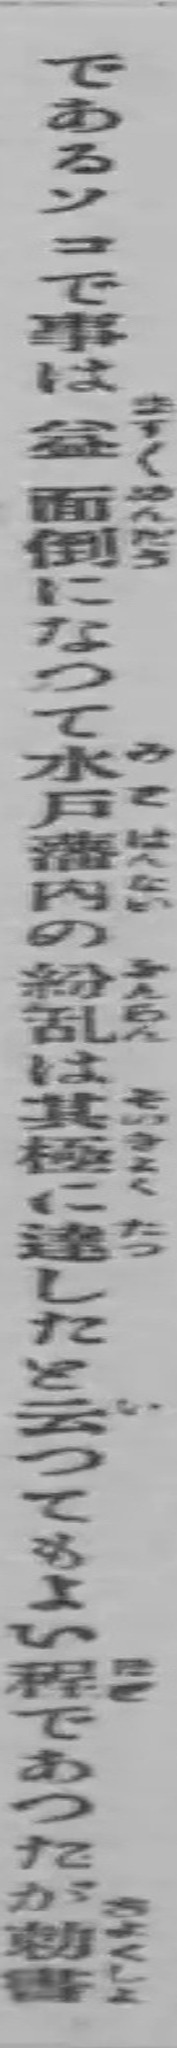であるソコで事は益面倒になつて水戸藩内の紛乱は其極に達したと云つてもよい程であつたが勅書
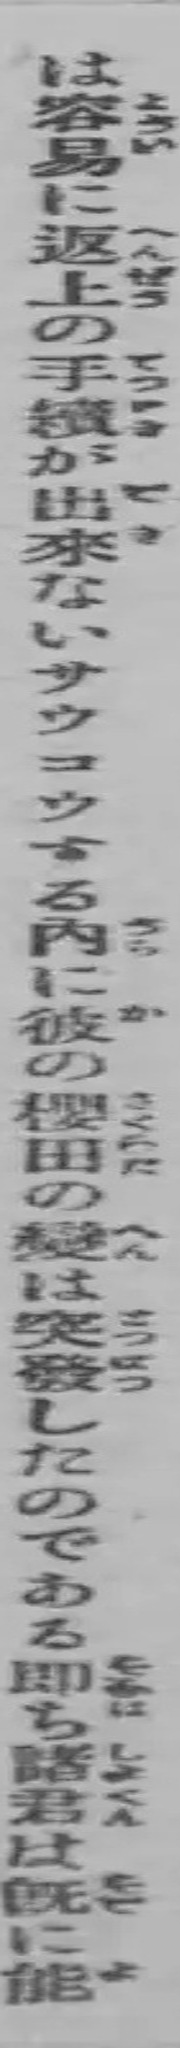は容易に返上の手続が出来ないサウコウする内に彼の桜田の変は突発したのである即ち諸君はすでに能
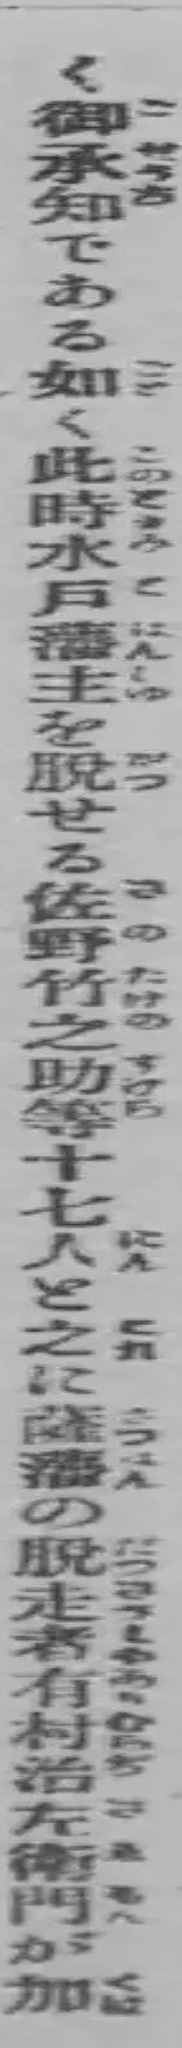く御承知である如く此時水戸藩主を脱せる佐野竹之助等十七人と之に薩藩の脱走者有村治左衛門が加
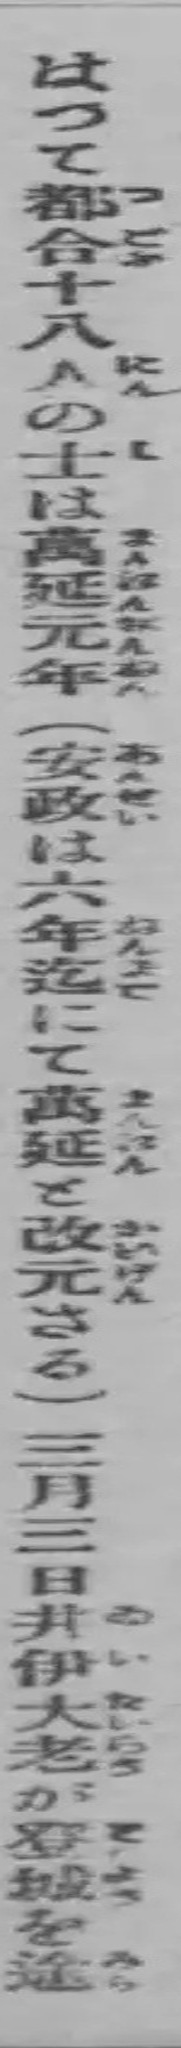はつて都合十八人の士は万延元年(安政は六年迄にて万延と改元さる)三月三日井伊大老が登城を途

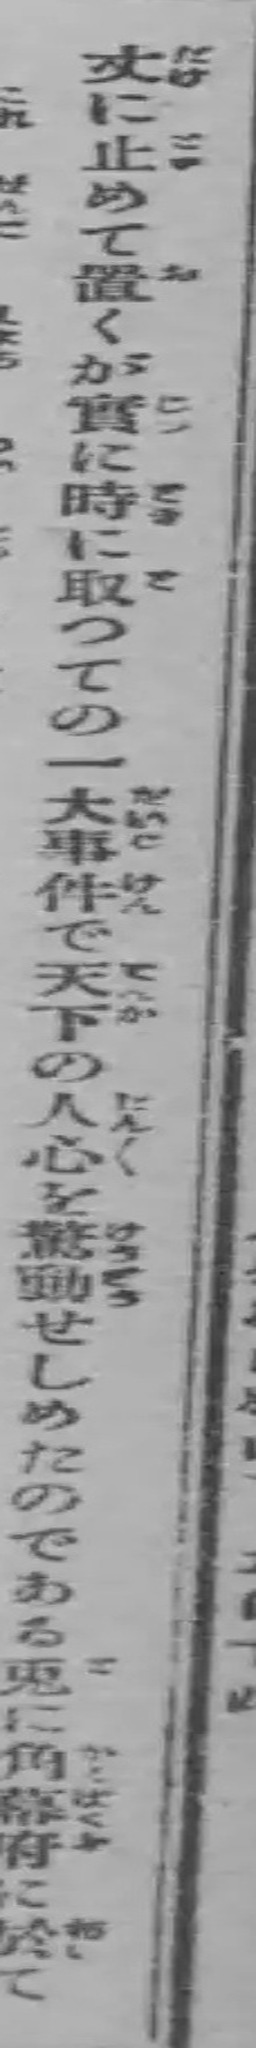丈に止めて置くが実に時に取つての一大事件で天下の人心を驚動せしめたのである兎に角幕府に於て
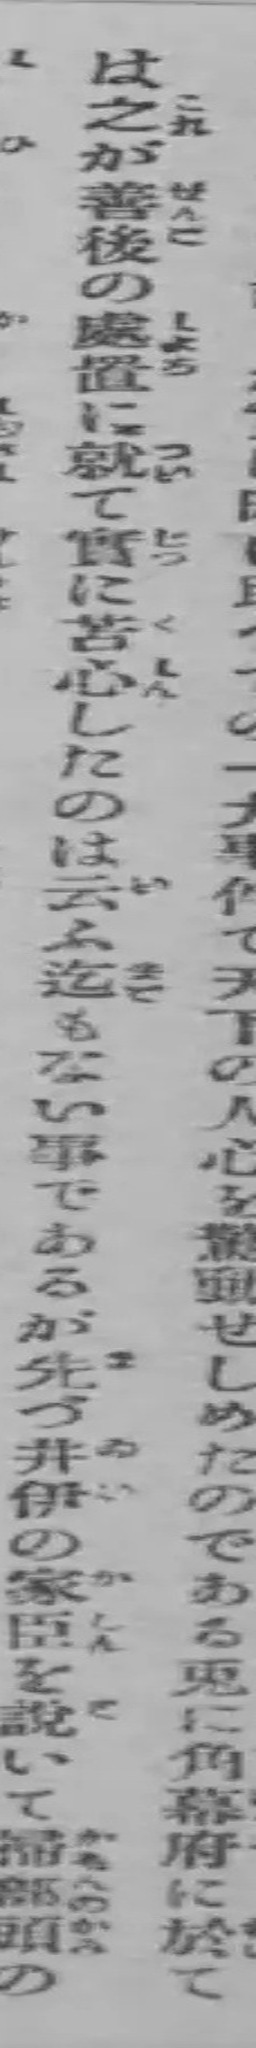は之が善後の処置に就て実に苦心したのは云ふ迄もない事であるが先づ井伊の家臣を説いて掃部頭の
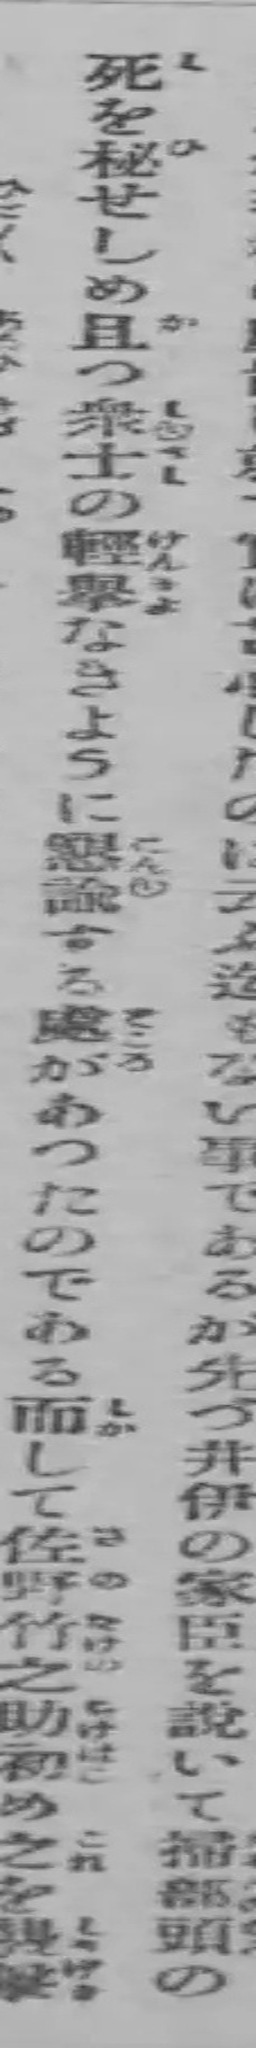死を秘せしめ且つ衆士の軽挙なきように懇諭する処があつたのである而して佐野竹之助初め之を襲撃
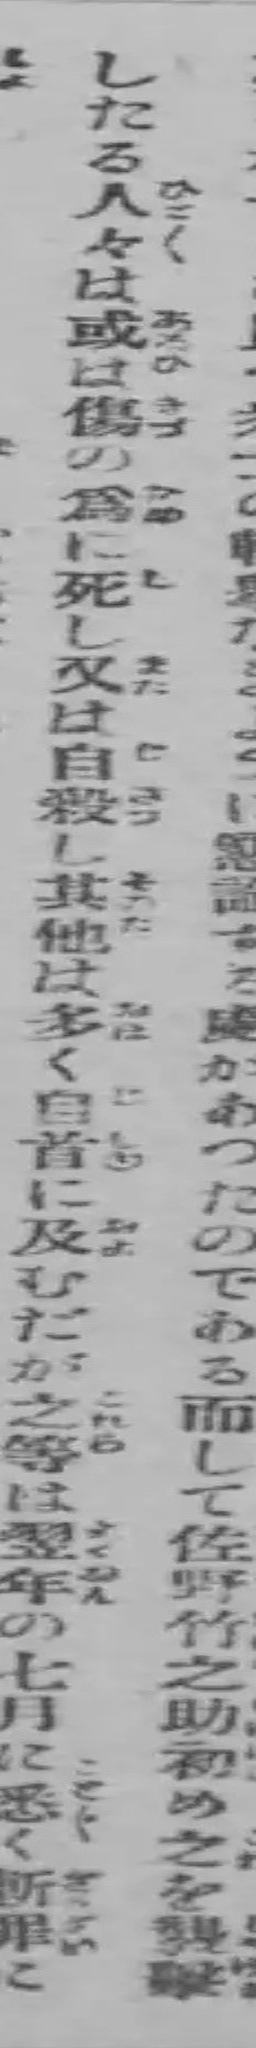したる人々は或は傷の為に死し又は自殺し其他は多く自首に及むだが之等は翌年の七月に悉く斬罪に
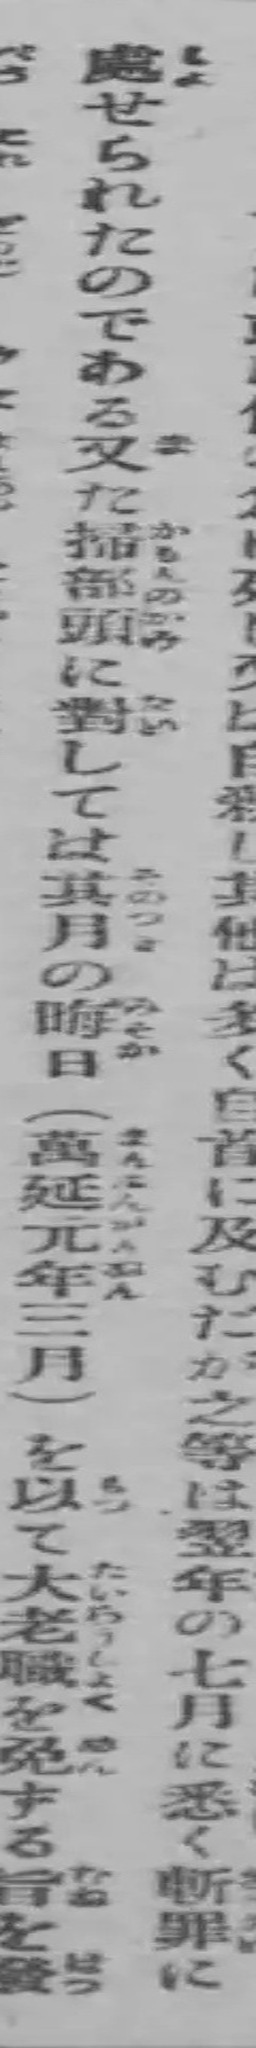処せられたのである又た掃部頭に対しては其月の晦日(万延元年三月)を以て大老職を免ずる旨を発
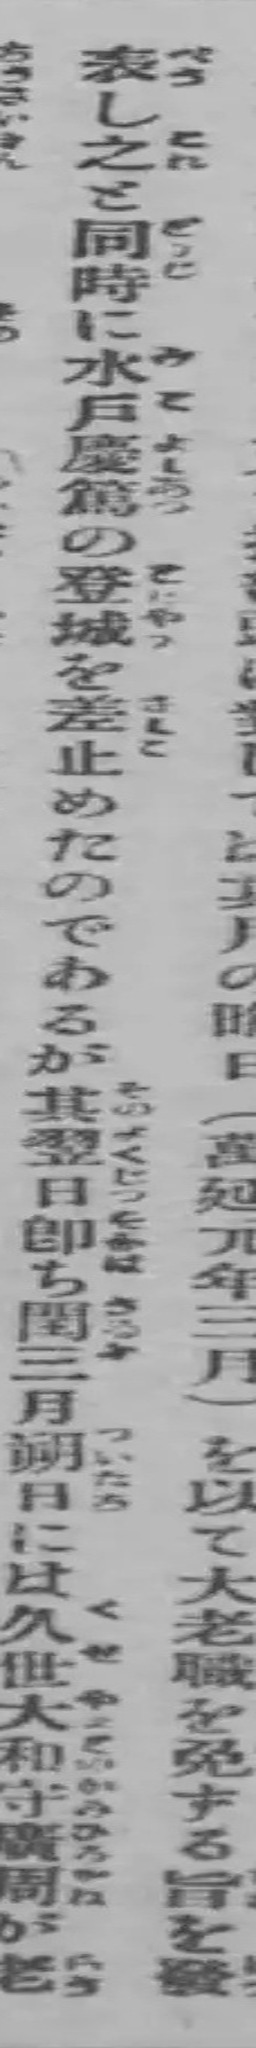表し之と同時に水戸慶篤の登城を差止めたのであるが其翌日即ち閏三月朔日には久世大和守廣周が老
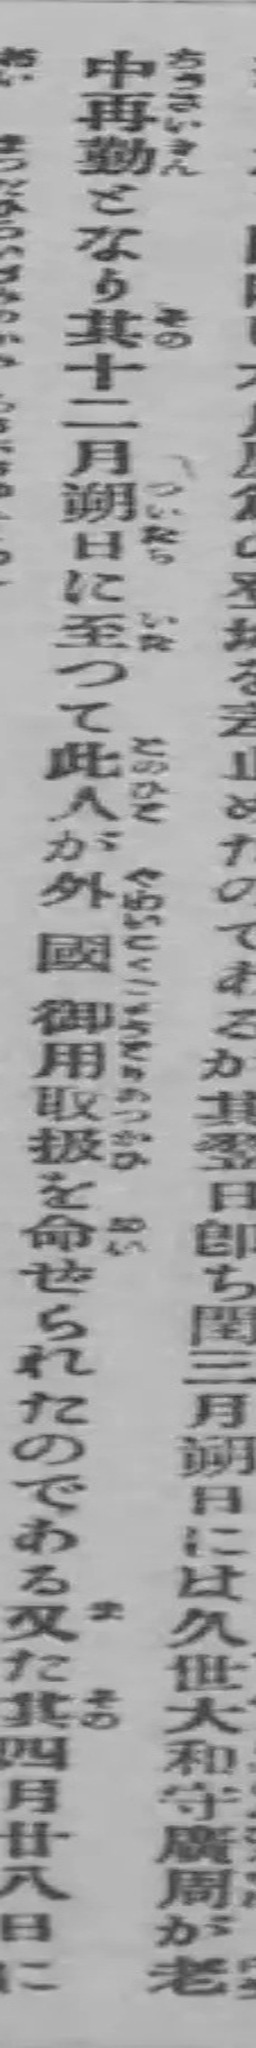中再勤となり其十二月朔日に至つて此人が外国御用取扱を命ぜられたのである又た其四月廿八日に
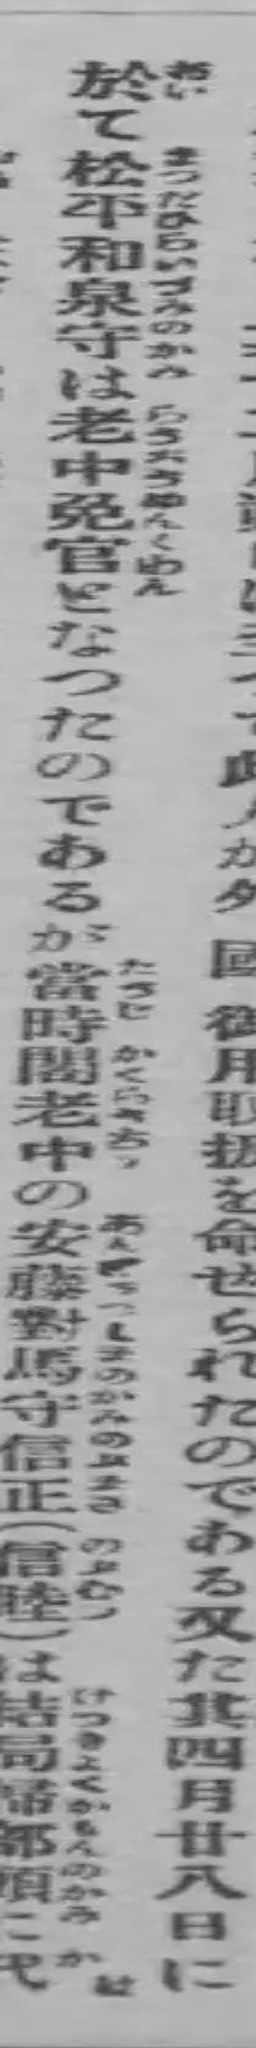於て松平和泉守は老中免官となつたのであるが当時閣老中の安藤対馬守信正(信睦)は結局掃部頭に代
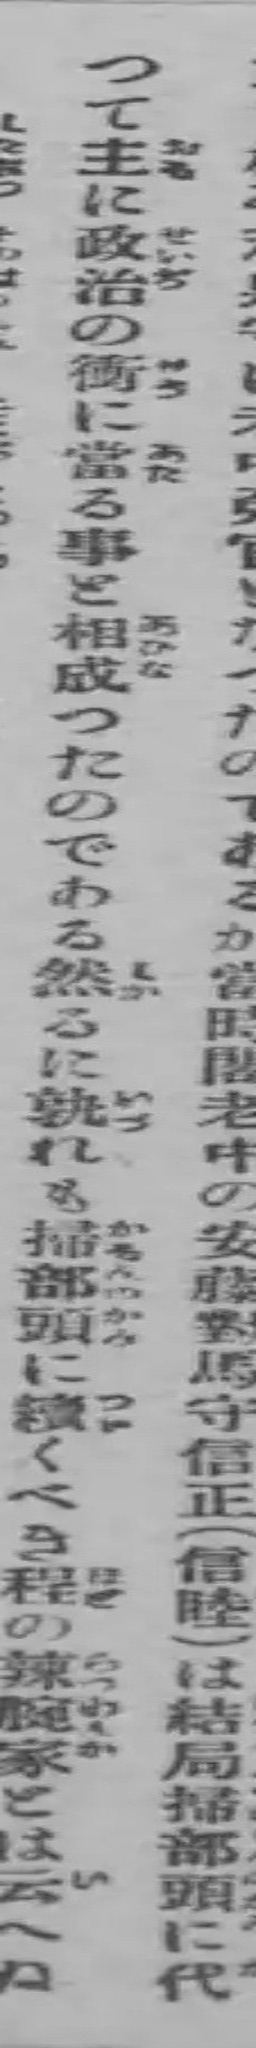つて主に政治の衝に当る事となつたのである然るに孰れも掃部頭に続くべき程の辣腕家とは云へぬ
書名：豊橋市史談
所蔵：国立国会図書館 National Diet Library, JAPAN
